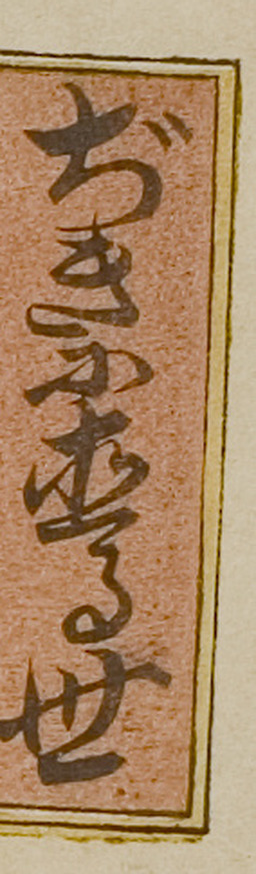ぢきに直る世
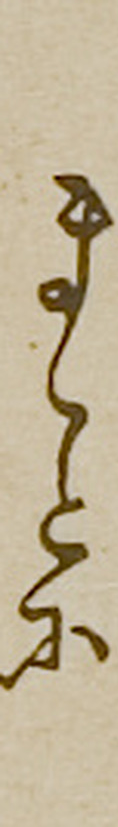まことに
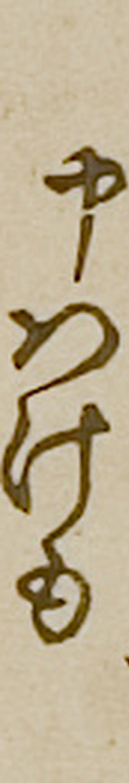申わけも
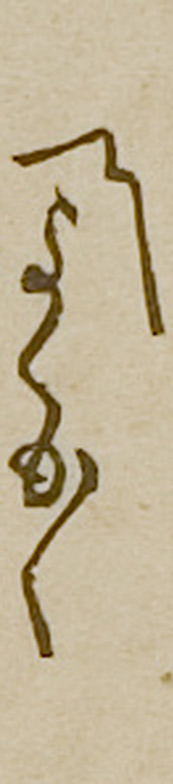〽よくも〳〵
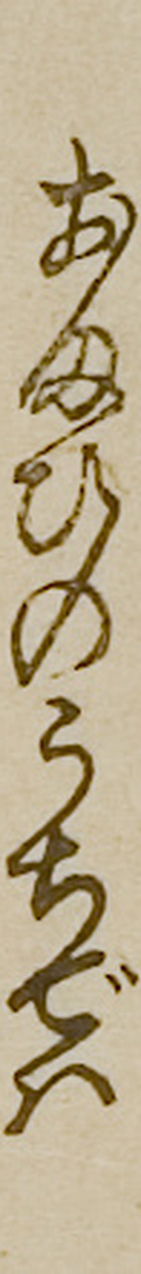おまひのうちでは
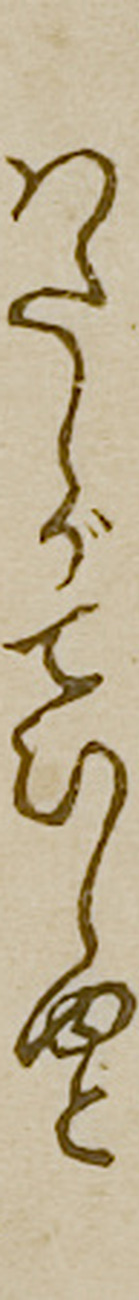わたしがていしゆと
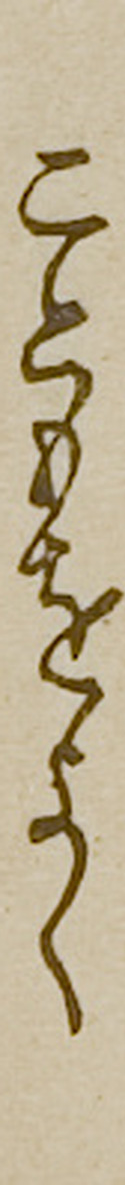こともをよく
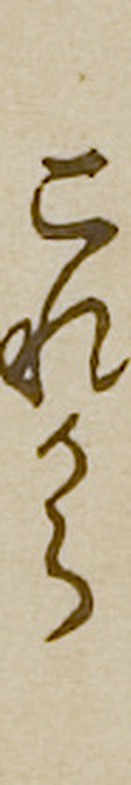これから
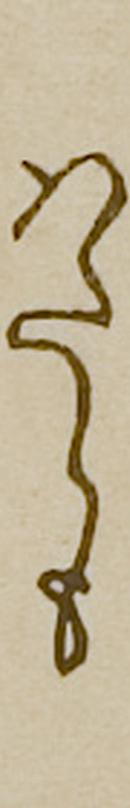わたしも
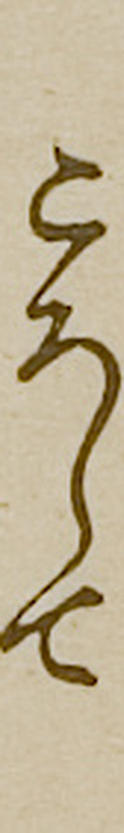ころして
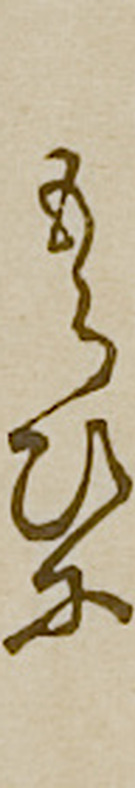もらひに
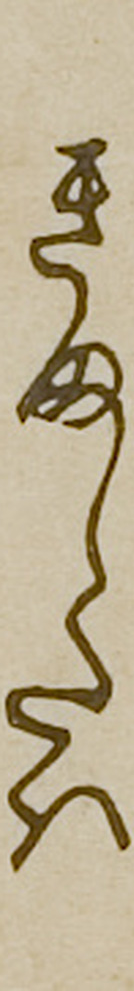きましたは
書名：ぢきに直る世
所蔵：東京大学総合図書館 General Library in the University of Tokyo, JAPAN
